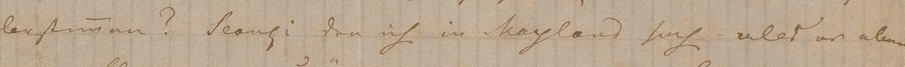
bestimmen? Scanzi den ich in Mayland sah – als er eben
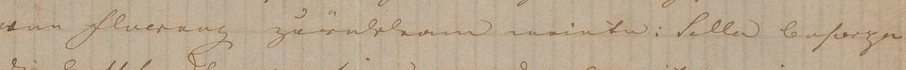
von Florenz zurükkam meinte: Sella besorge
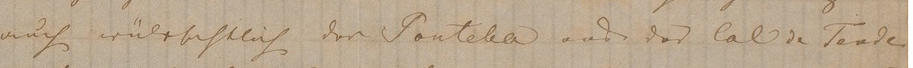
auch rüksichtlich der Ponteba und des Col de Tende
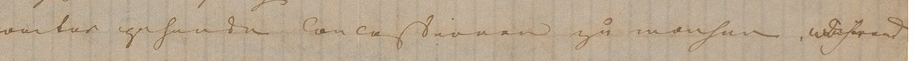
weiter gehende Concessionen zu machen, während
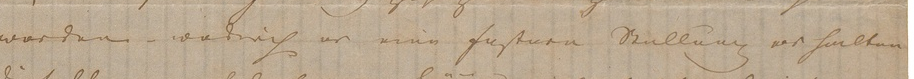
werden – wodurch er eine festere Stellung erhalten
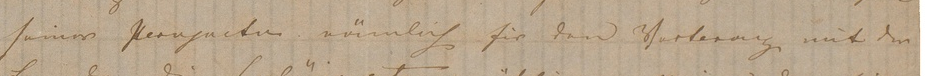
seines Projectes nämlich für den Vertrag mit der
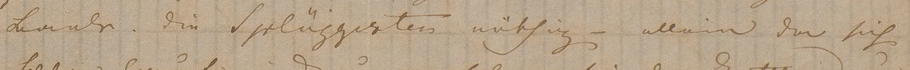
Bank – die Splüggisten nöthig – allein da sich
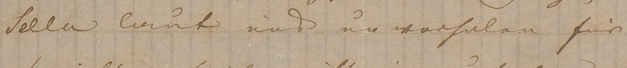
Sella laut und unverholen für
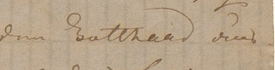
den Gotthard aus-
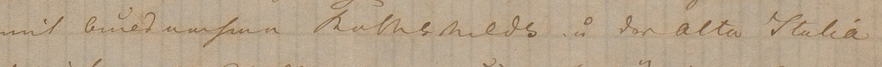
mit Ausnahme Rothschilds in der alta Italia
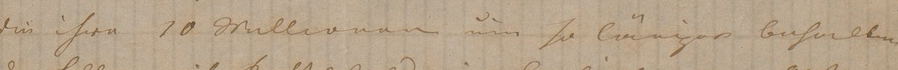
die ihre 10 Millionen um so länger behalten.
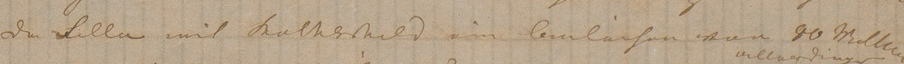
Da Sella mit Rothschild ein Anleihen von 80 Millionen
